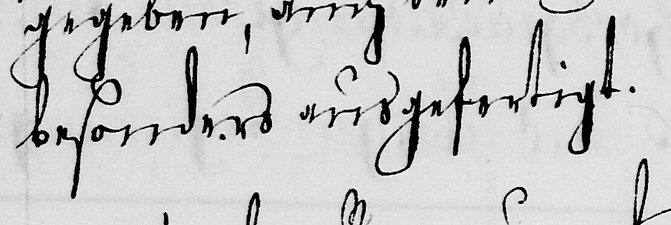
besonders ausgefertigt.
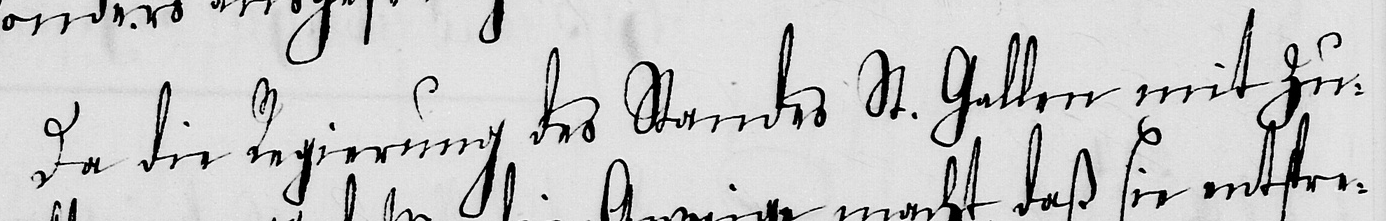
Da die Regierung des Standes St. Gallen mit Zu¬
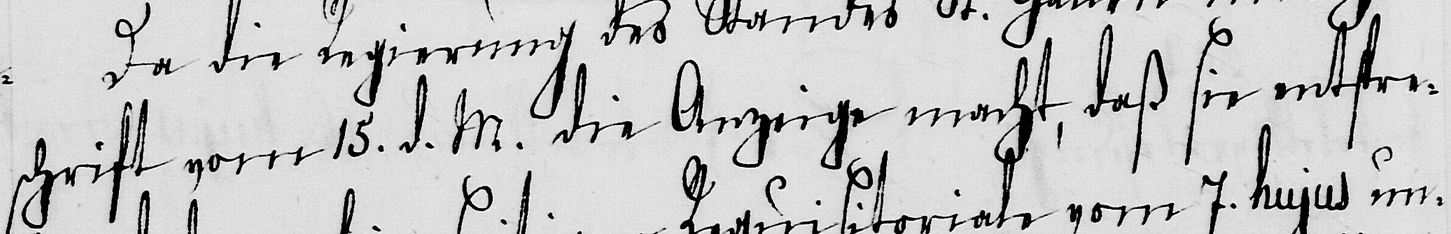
schrift vom 15. d. M. die Anzeige macht, daß sie entspre¬
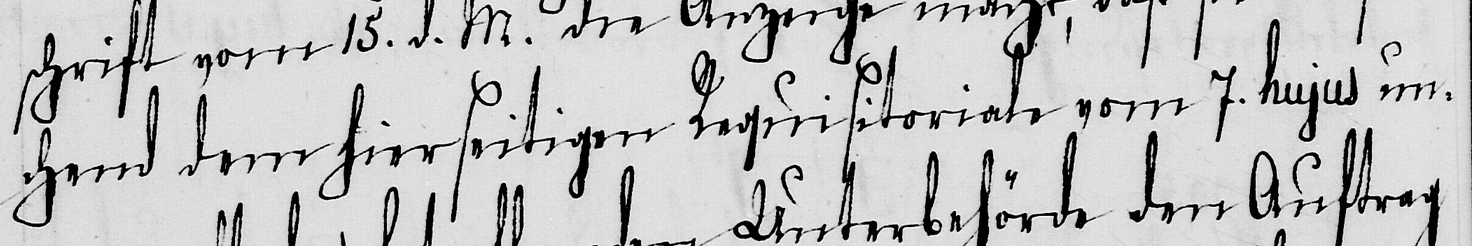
chend dem hierseitigen Requisitoriale vom 7. hujus un¬
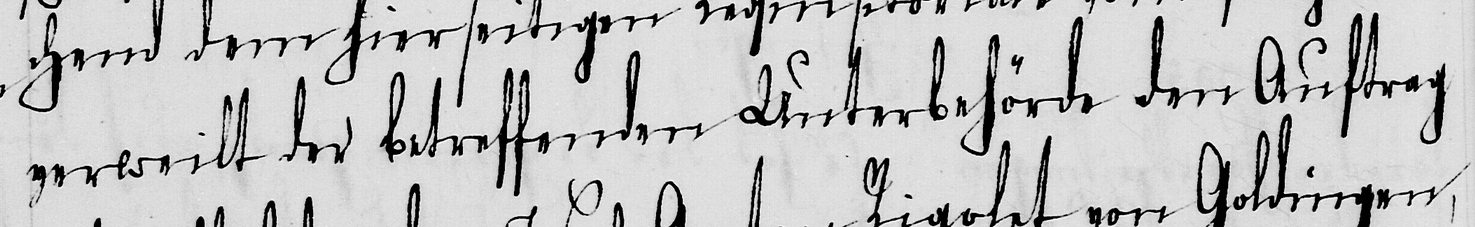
verweilt der betreffenden Unterbehörde den Auftrag
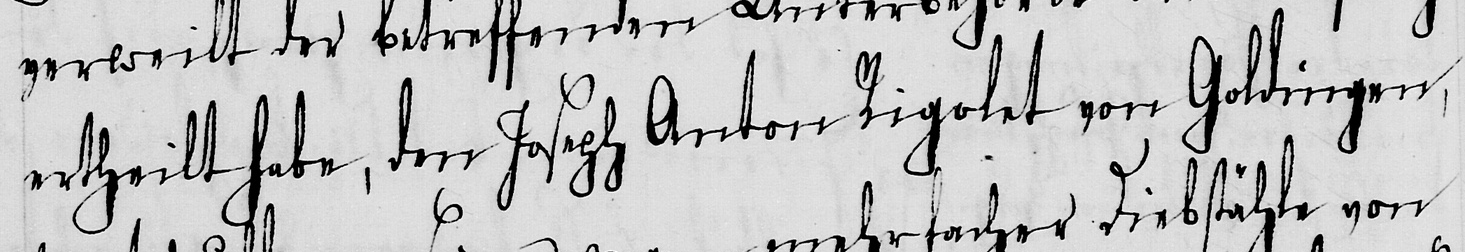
ertheilt habe, den Joseph Anton Rigolet von Goldingen,
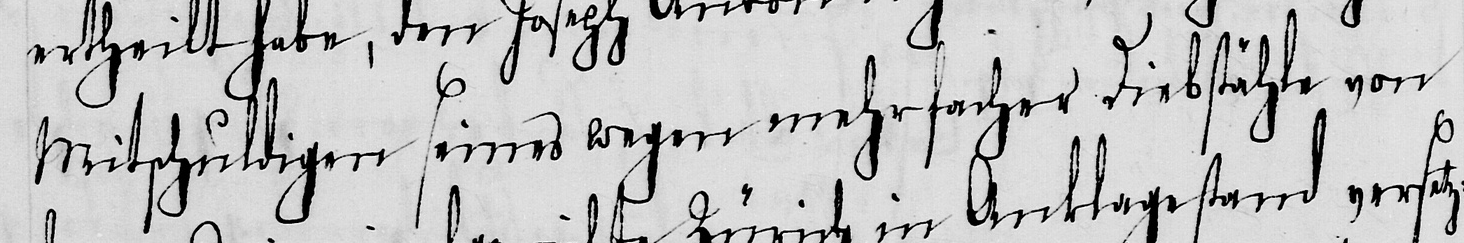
Mitschuldigen seines wegen mehrfacher Diebstähle von
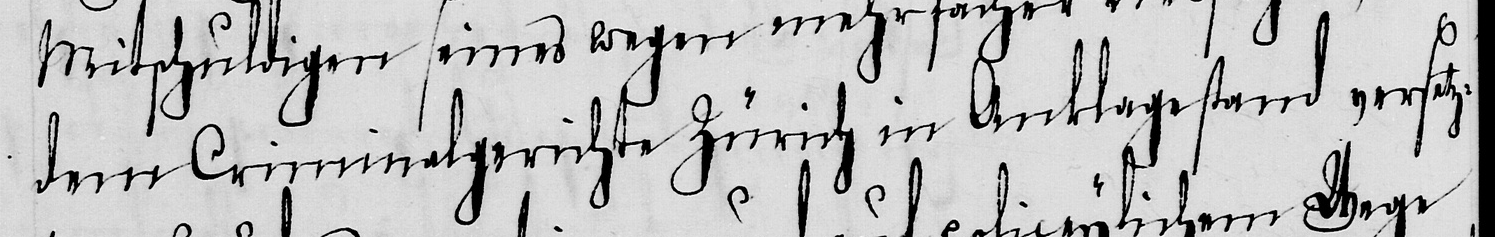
dem Criminalgerichte Zürich in Anklagestand versetz¬
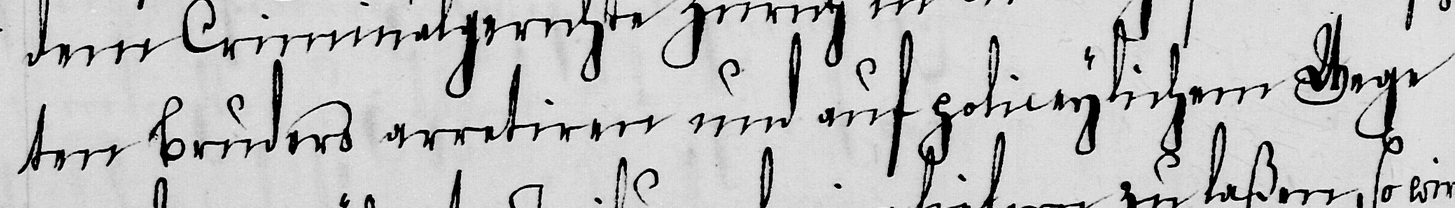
ten Bruders arretiren und auf policeylichem Wege
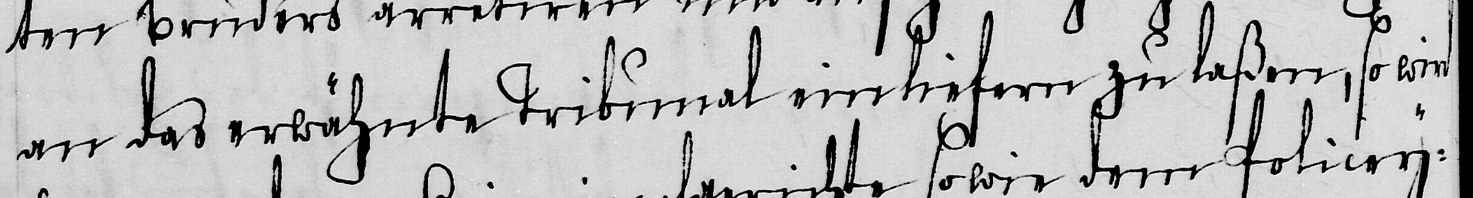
an das erwähnte Tribunal einliefern zu laßen, so wi¬
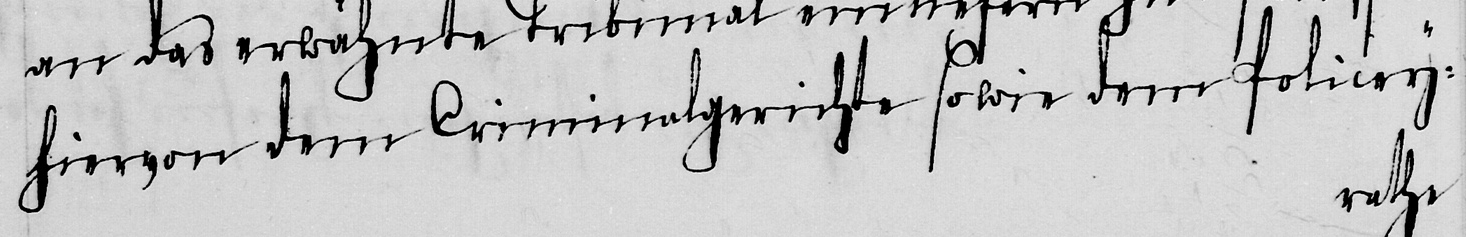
hiervon dem Criminalgerichte sowie dem Policey-
